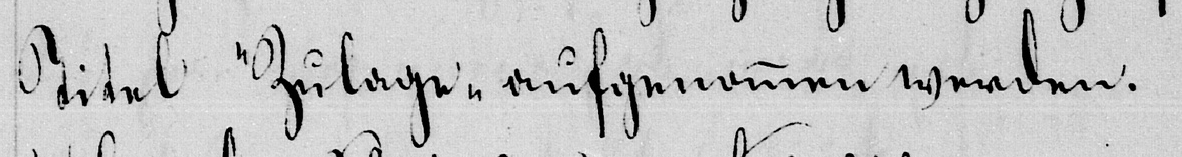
Titel „Zulage“ aufgenommen werden.
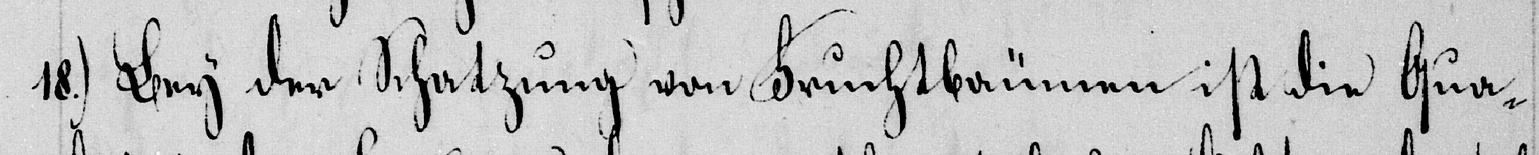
18) Bey der Schatzung von Fruchtbäumen ist die Qua¬
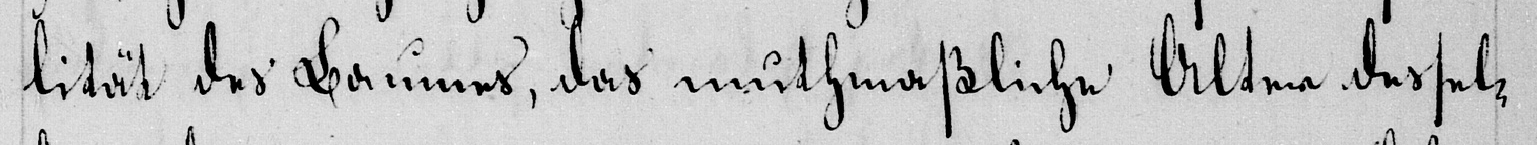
lität des Baumes, das muthmaßliche Alter dessel¬
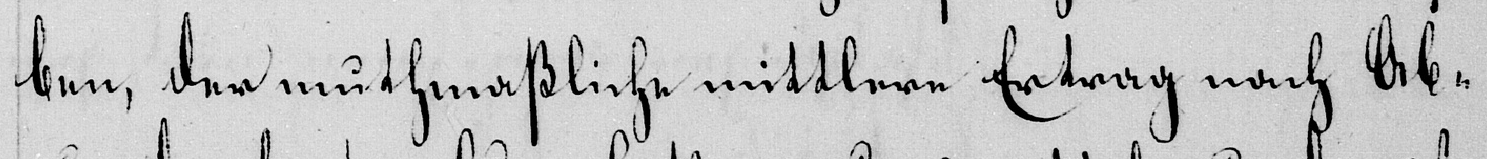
ben, der muthmaßliche mittlere Ertrag nach Ab¬
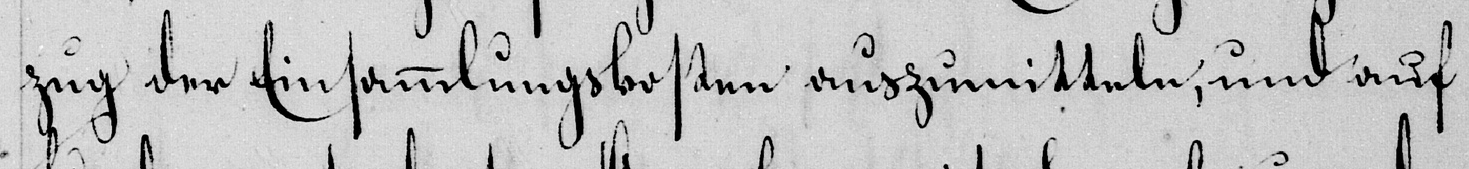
zug der Einsammlungskosten auszumitteln, und auf
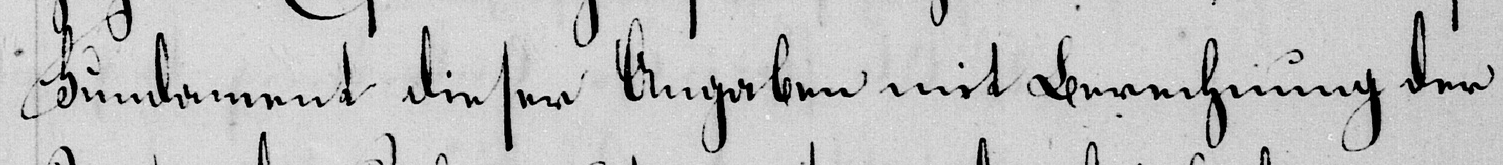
Fundament dieser Angaben mit Berechnung der
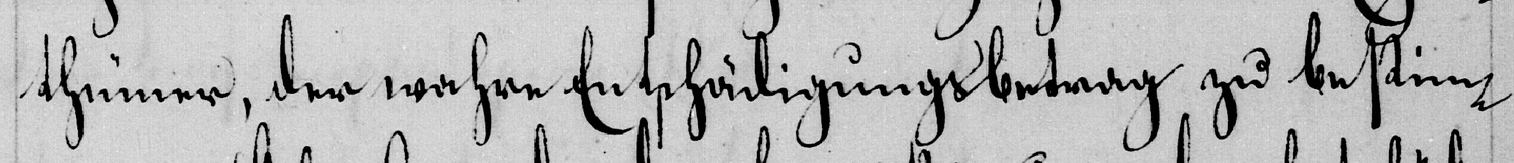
thümer, der wahre Entschädigungsbetrag zu bestim¬
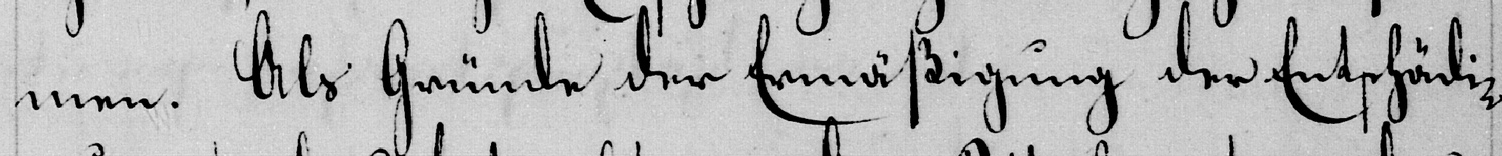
men. Als Gründe der Ermäßigung der Entschädi¬
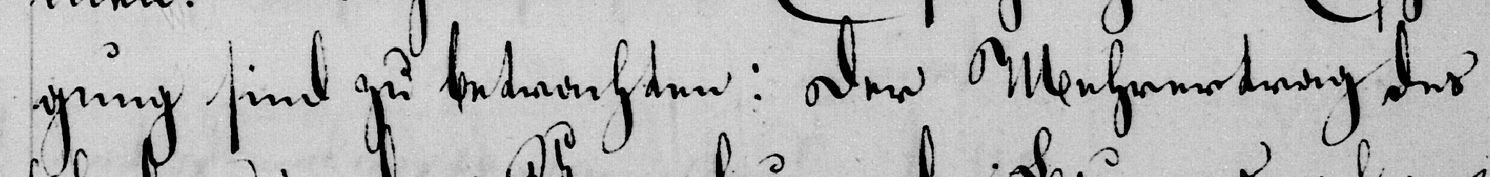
gung sind zu betrachten: Der Mehrertrag des
